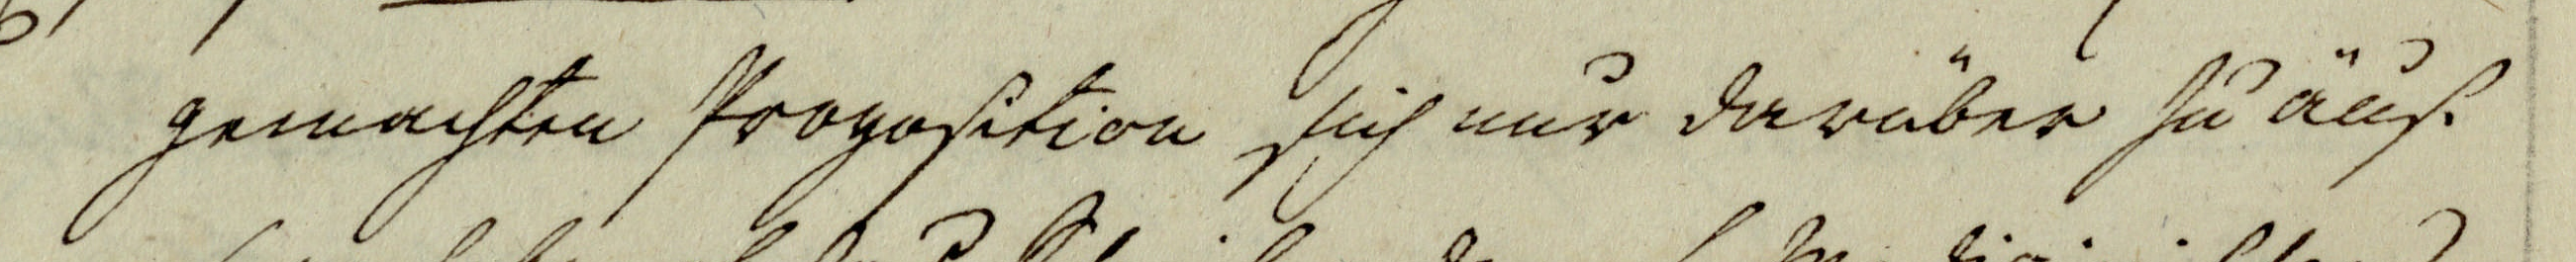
gemachten Proposition sich nur darüber zu äus¬
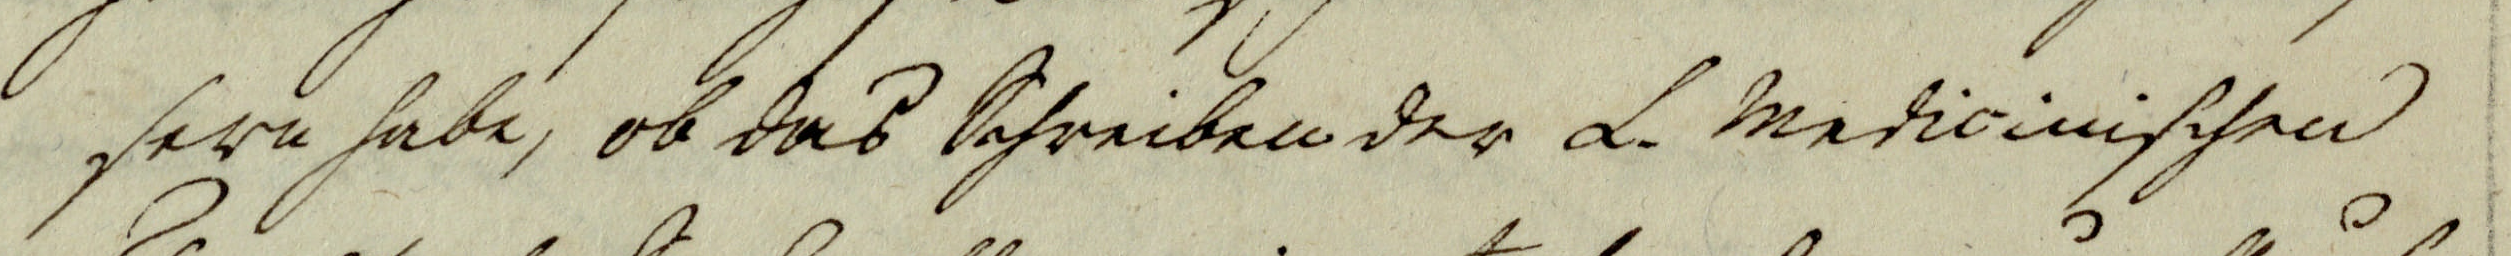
sern habe, ob das Schreiben der L. Medicinischen
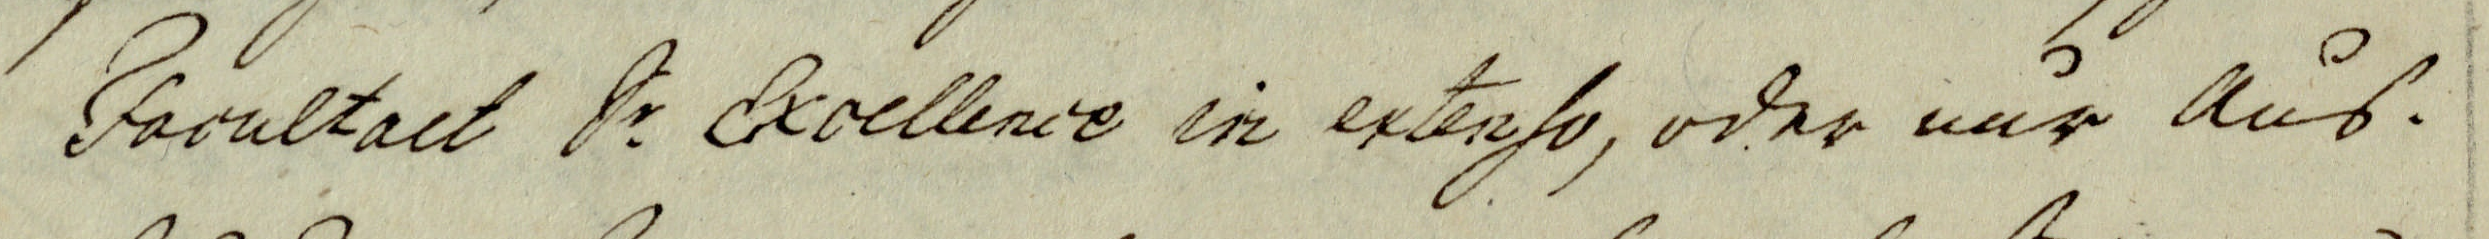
Facultaet Sr Excellence in extenso, oder nur Aus¬
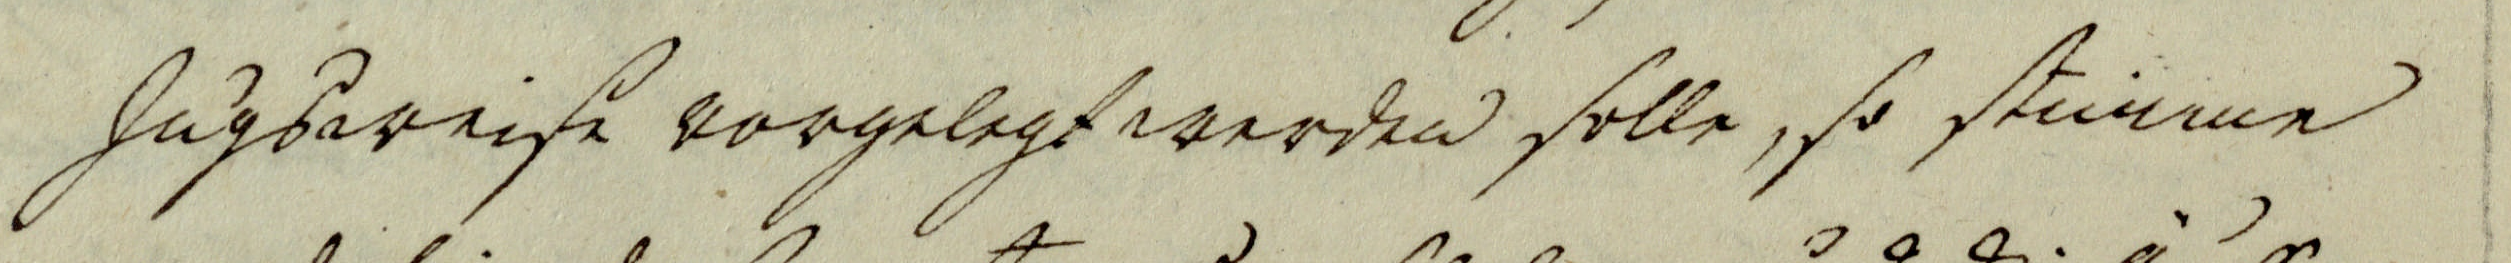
zugsweise vorgelegt werden solle, so stimme
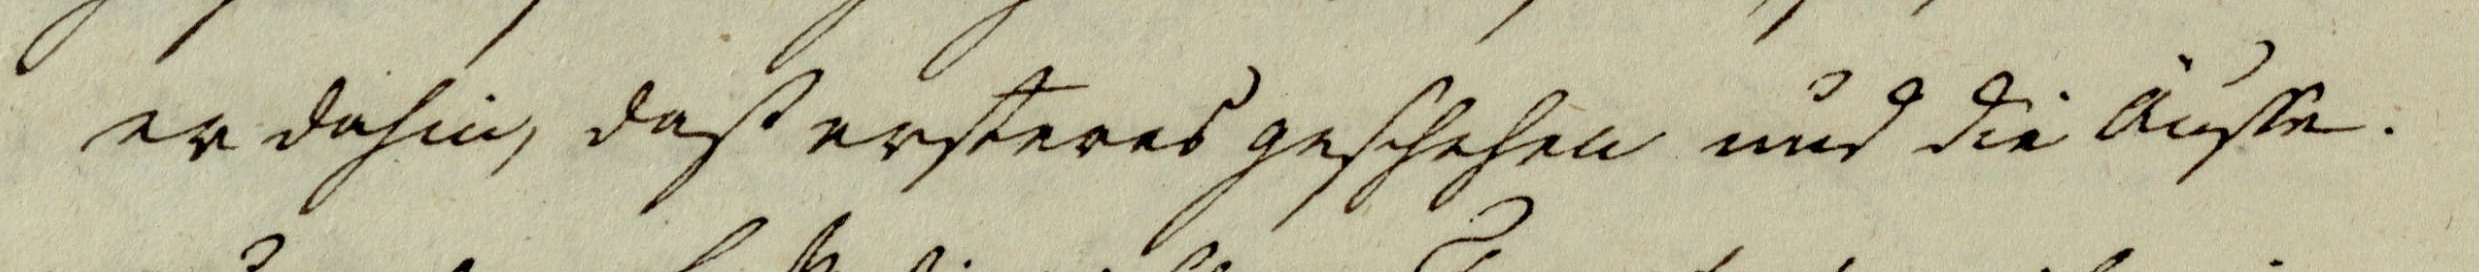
er dahin, daß ersteres geschehen und die Äusse¬
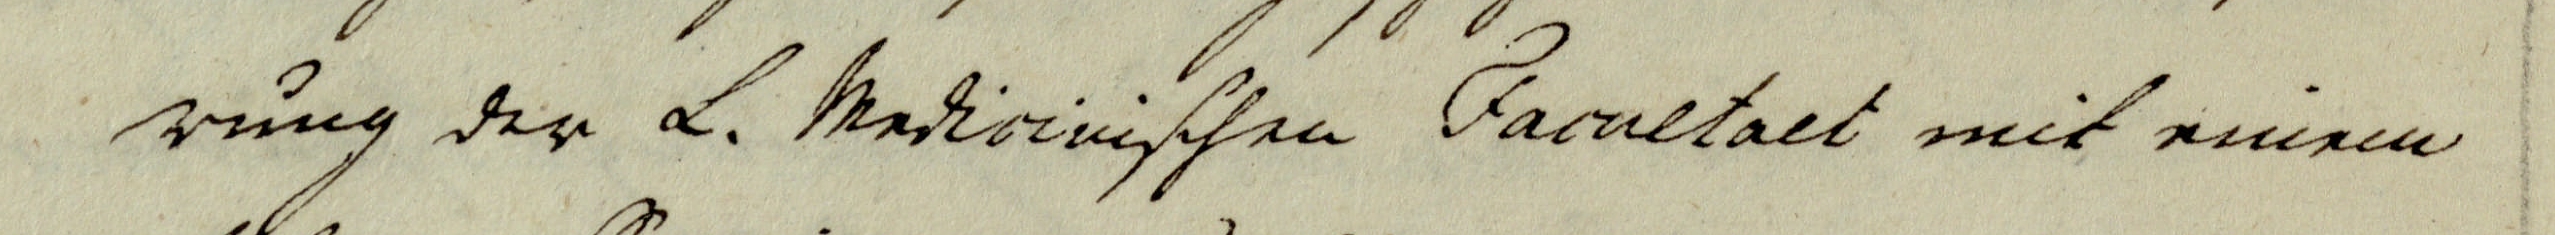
rung der L. Medicinischen Facultaet mit einem
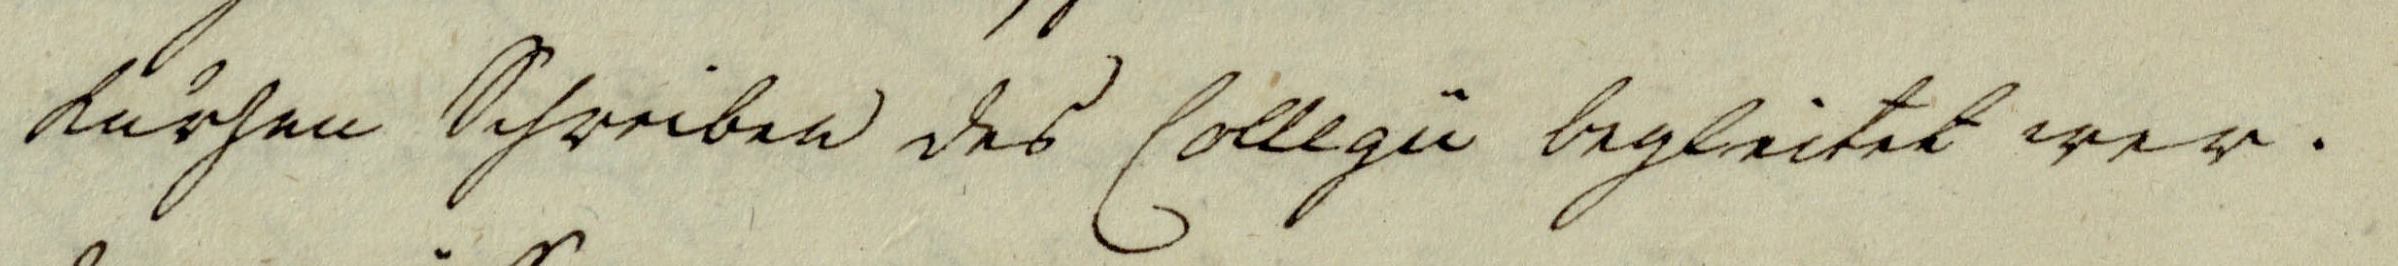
kurzen Schreiben des Collegii begleitet wer¬
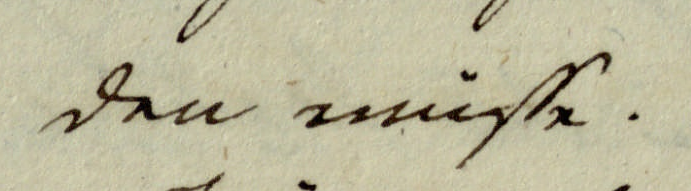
den müsse.
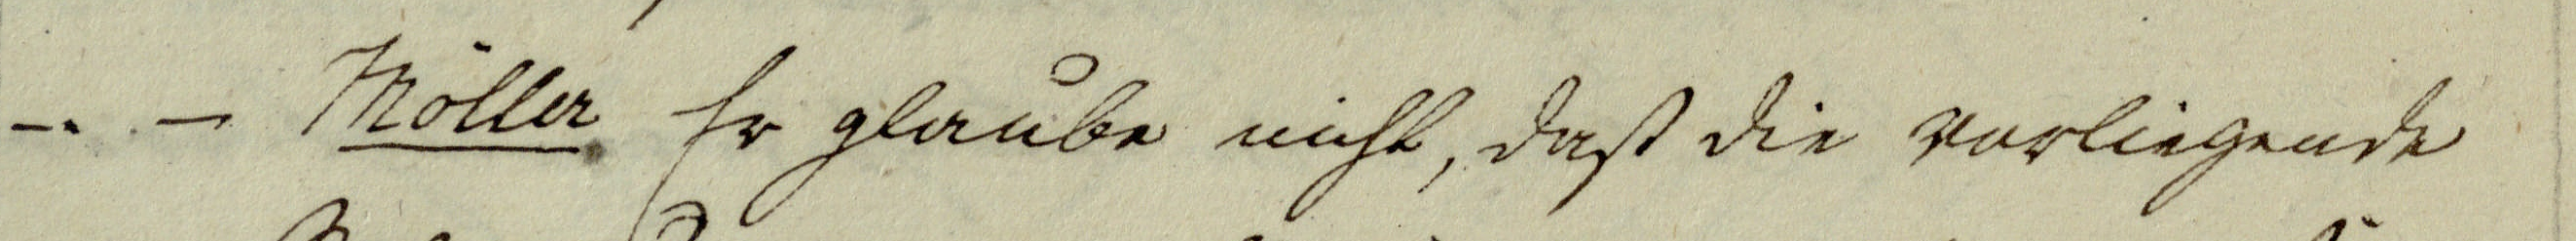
Möller. Er glaube nicht, daß die vorliegende
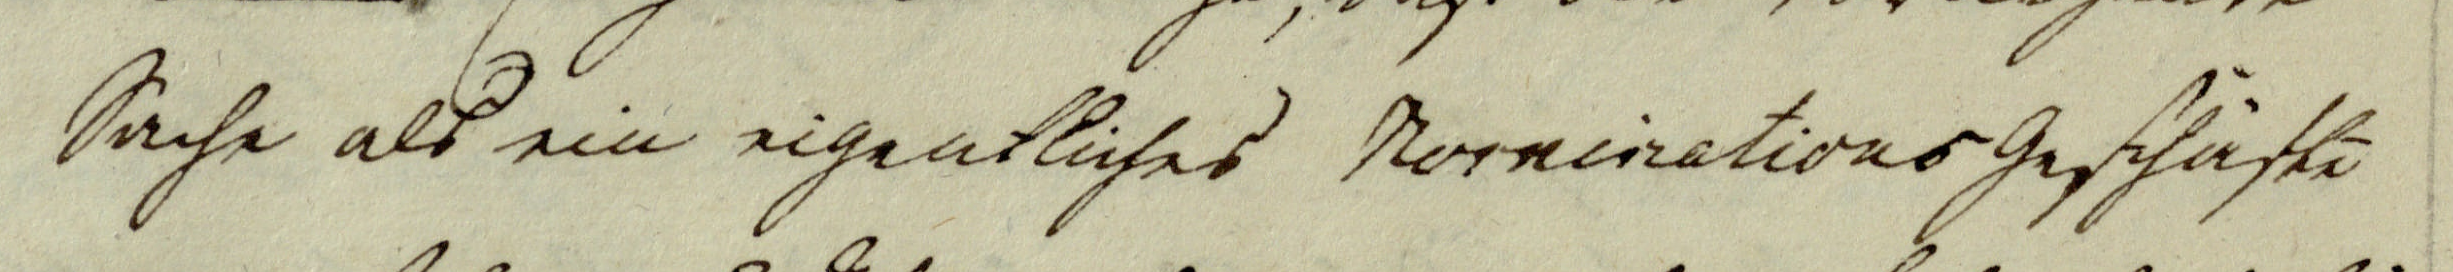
Sache als ein eigentliches NominationsGeschäfte
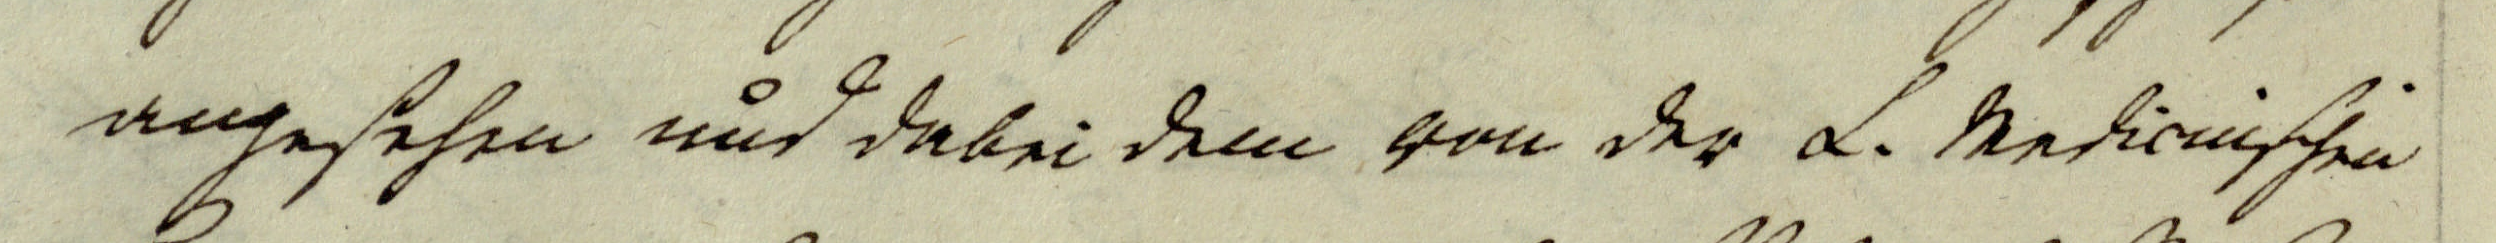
angesehen und dabei dem von der L. Medicinischen
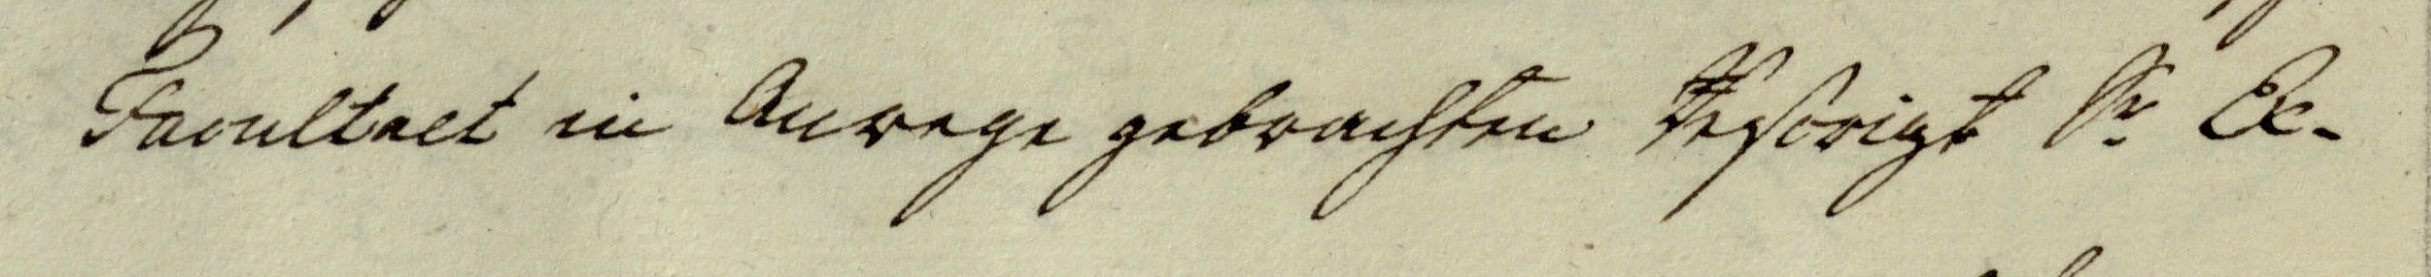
Facultaet in Anrege gebrachten Rescript Sr Ex¬
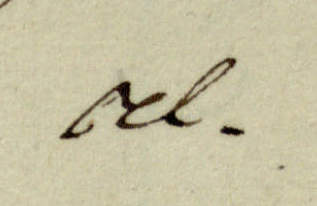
cel¬
